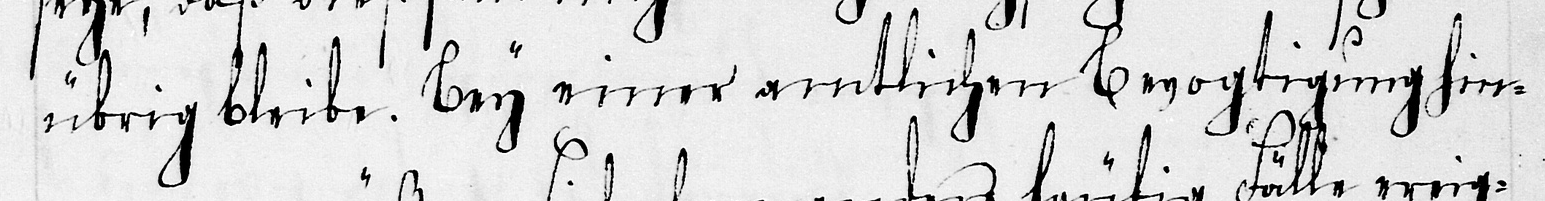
übrig bleibe. Bey einer amtlichen Bevogtigung hin¬
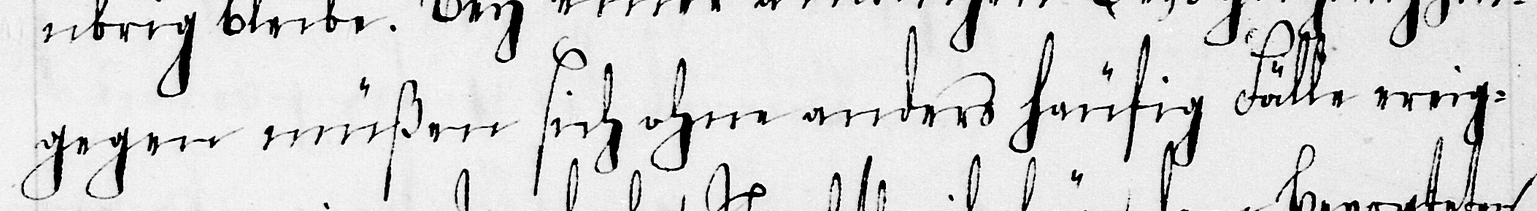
gegen müßen sich ohne anders häufig Fälle ereig¬
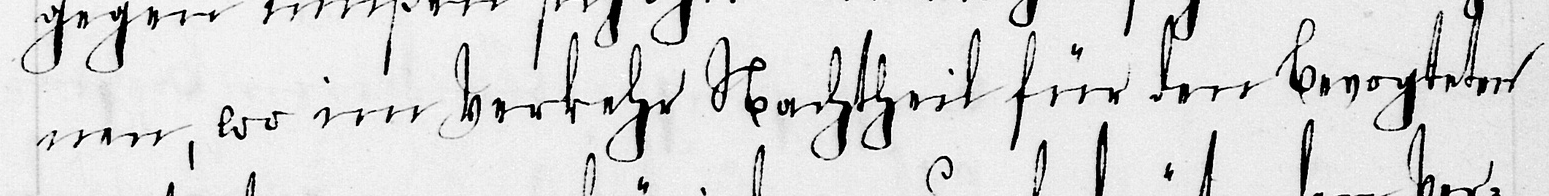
nen, wo im Verkehr Nachtheil für den Bevogteten
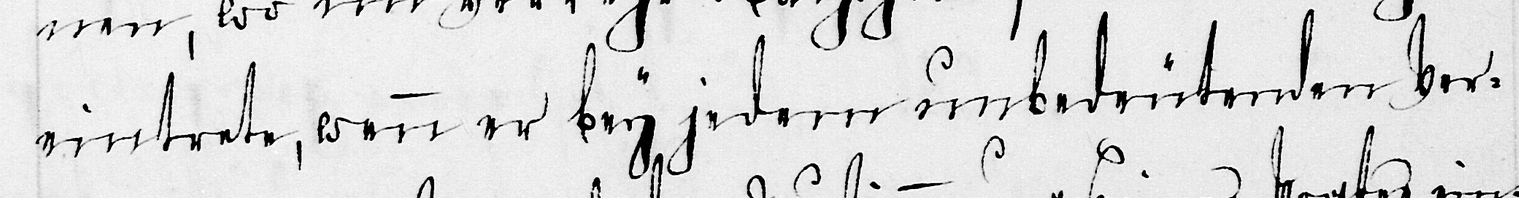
eintrete, wenn er bey jedem unbedeutenden Ver¬
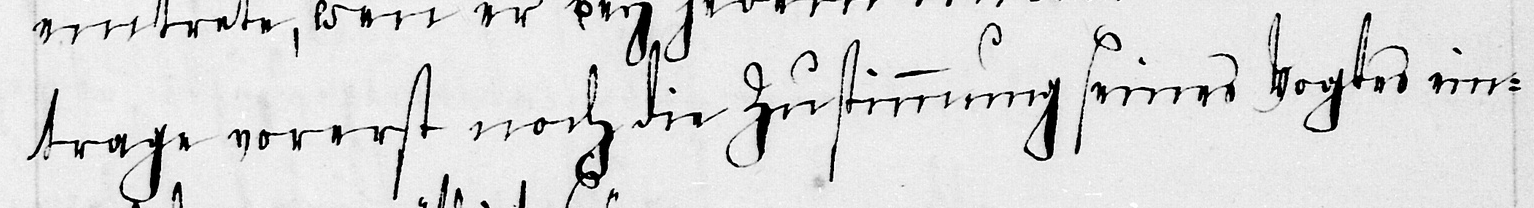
trage vorerst noch die Zustimmung seines Vogtes ein¬
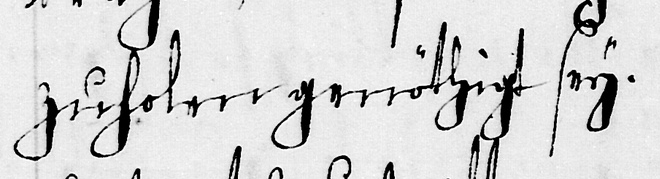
zuholen genöthigt sey.
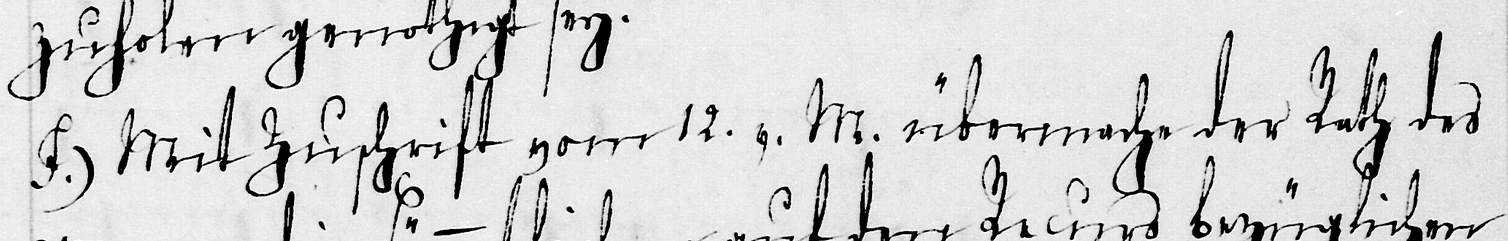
F.) Mit Zuschrift vom 12. v. M. übermache der Rath des
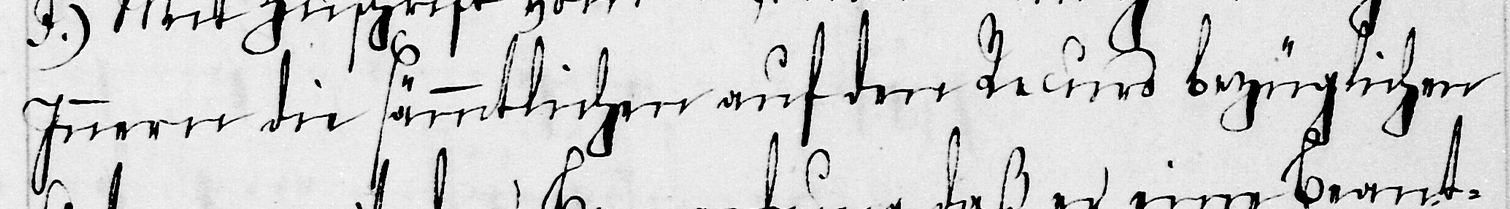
Innern die sämmtlichen auf den Recurs bezüglichen
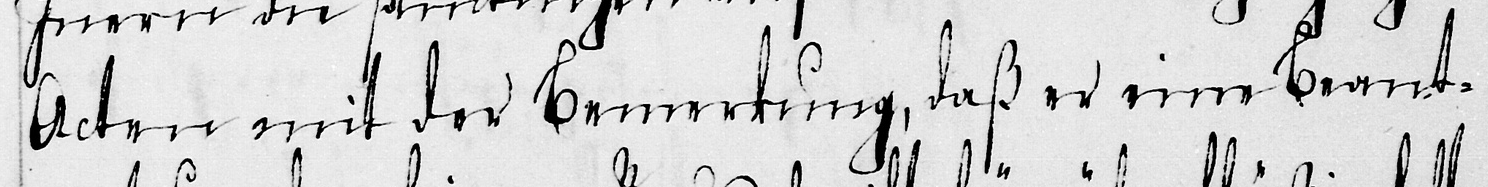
Acten mit der Bemerkung, daß er eine Beant¬
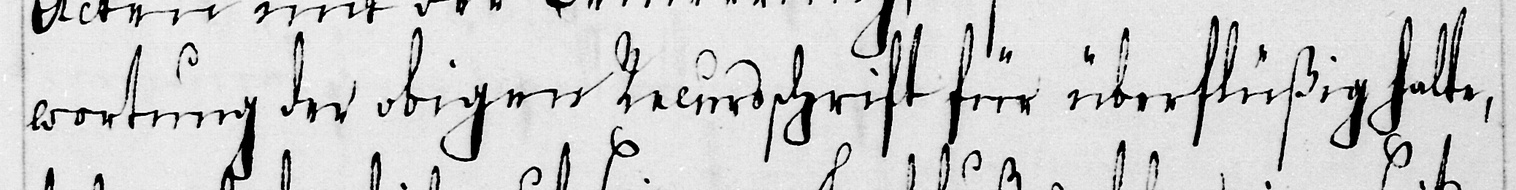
wortung der obigen Recursschrift für überflüßig halte,
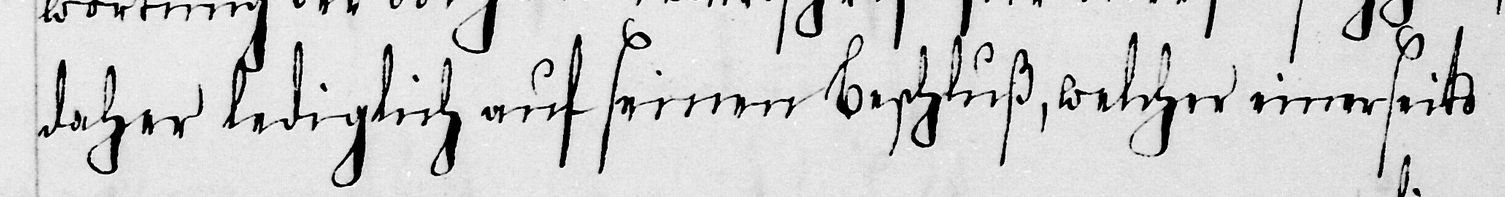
daher lediglich auf seinen Beschluß, welcher einerseits
